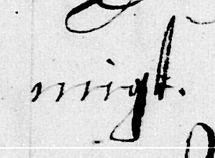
migt.
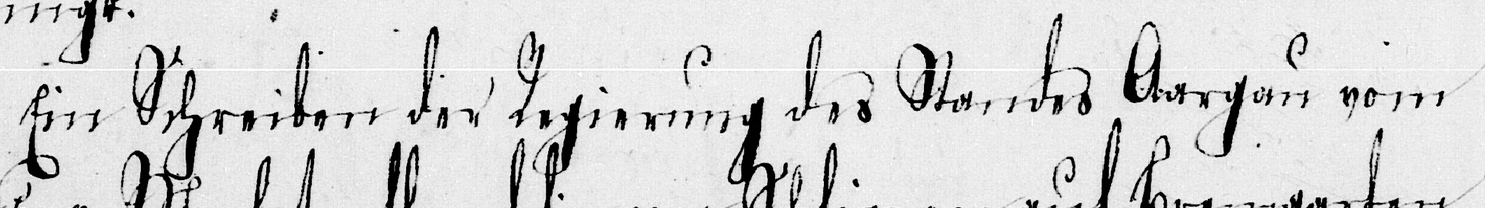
Ein Schreiben der Regierung des Standes Aargau vom
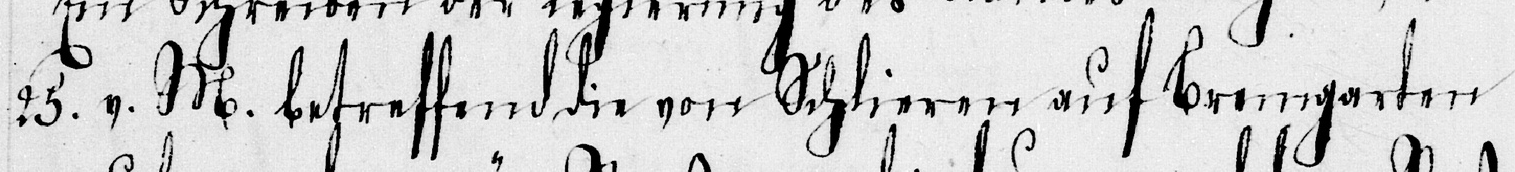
25. v. M. betreffend die von Schlieren auf Bremgarten
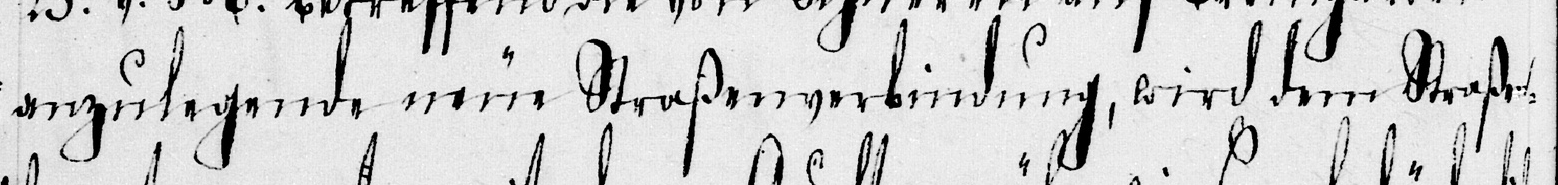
anzulegende neue Straßenverbindung, wird dem Straßen¬
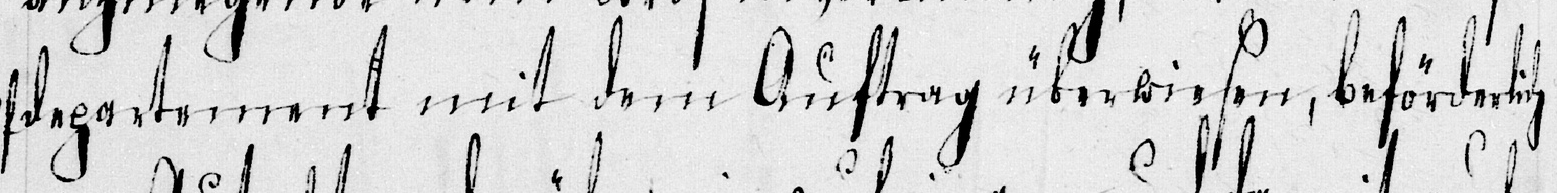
departement mit dem Auftrag überwiesen, beförderl¬
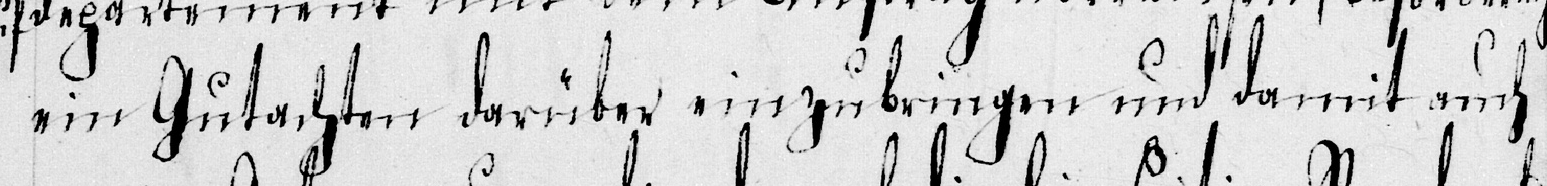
ein Gutachten darüber einzubringen und damit auch
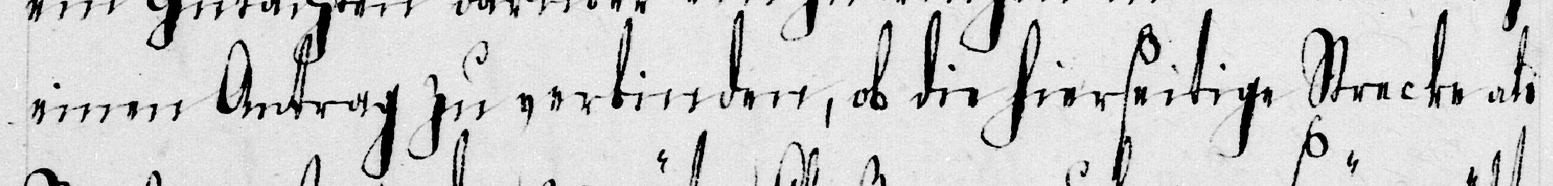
einen Antrag zu verbinden, ob die hierseitige Strecke als
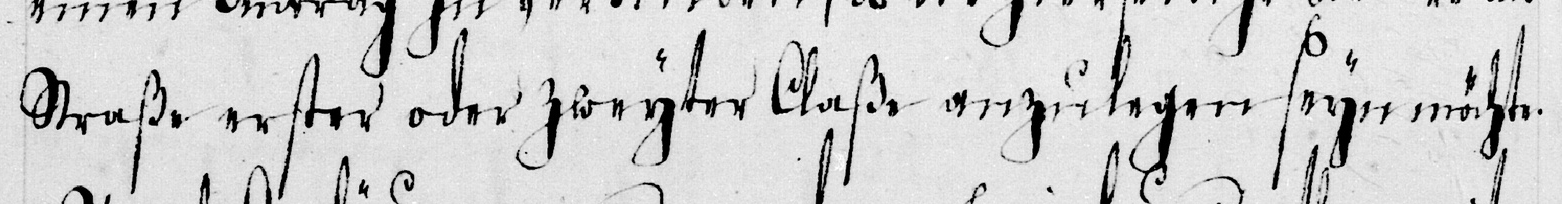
Straße erster oder zweyter Claße anzulegen seyn möchte.
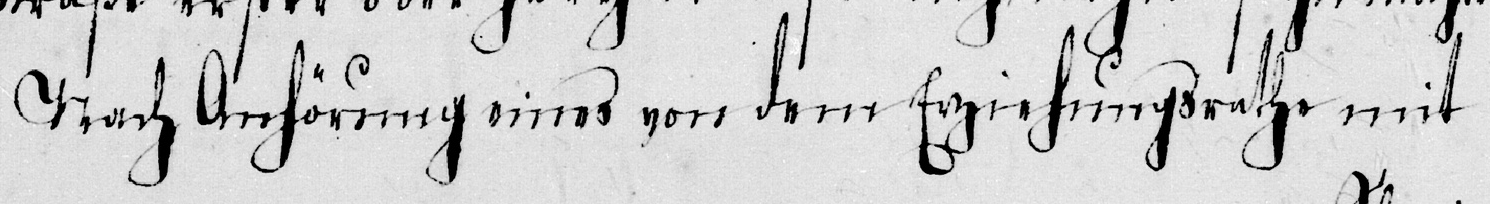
Nach Anhörung eines von dem Erziehungsrathe mit
